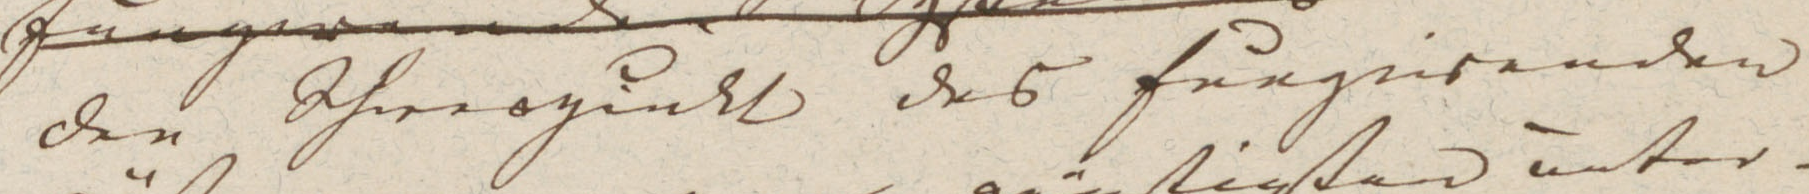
den Schwerpunkt des fungirenden
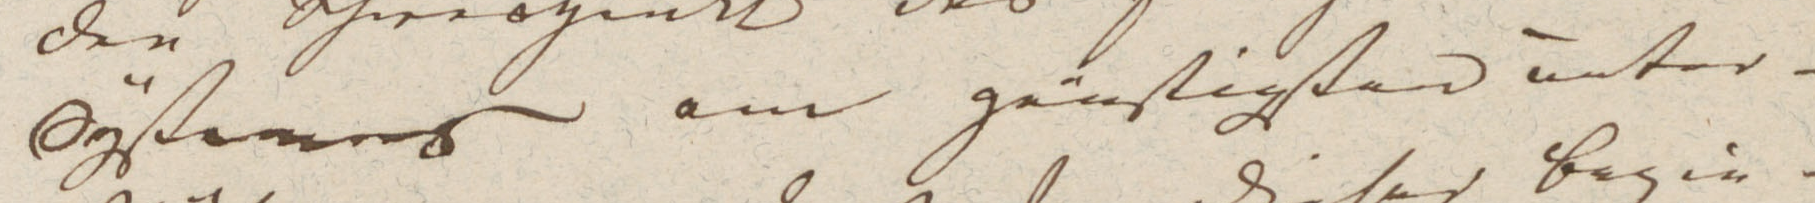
Systemes am günstigsten unter-
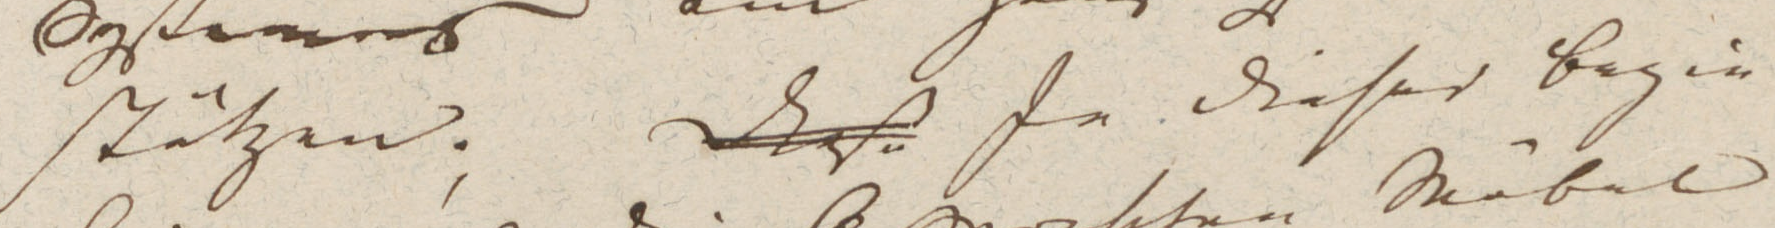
stützen; Dass In dieser Bezieh-
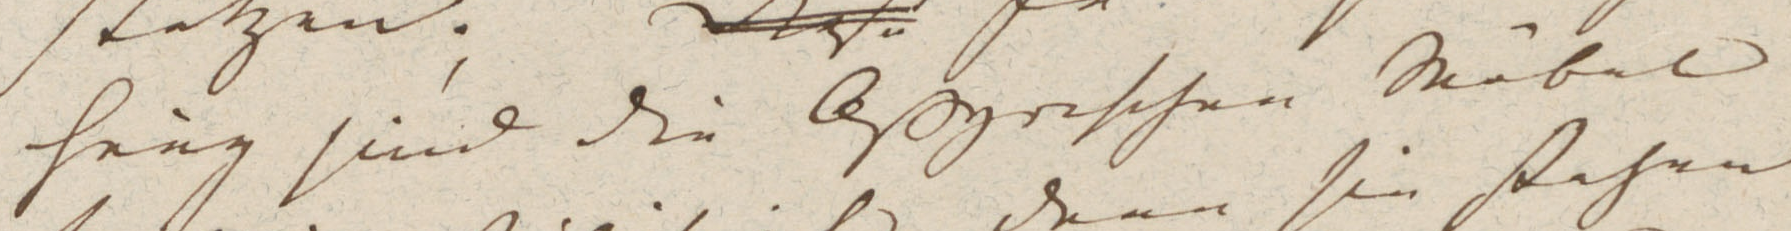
hung sind die Assyrischen Möbel
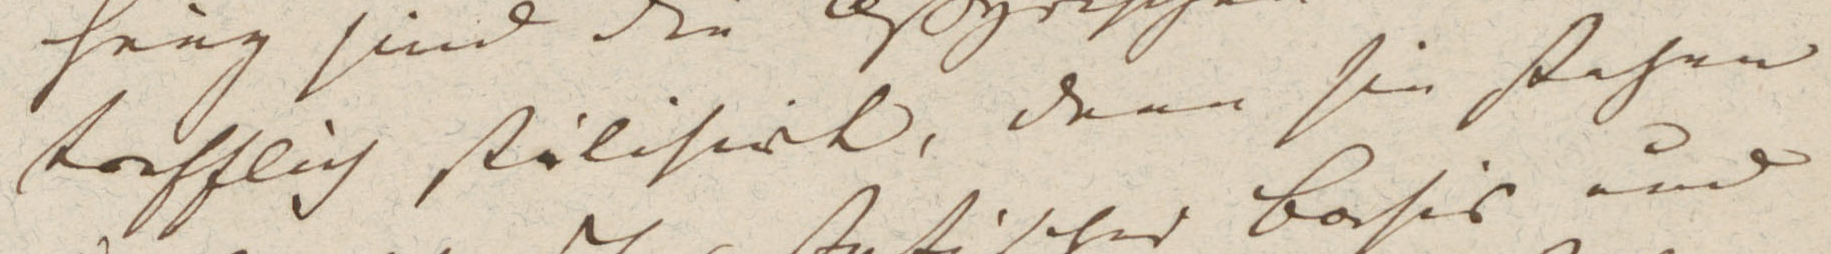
trefflich stilisirt, denn sie stehen
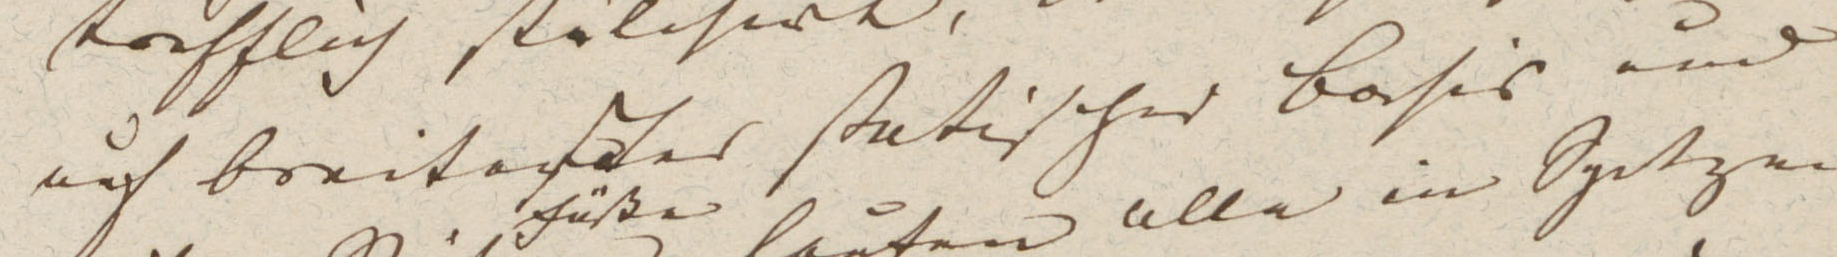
auf breiterster statischer Basis und
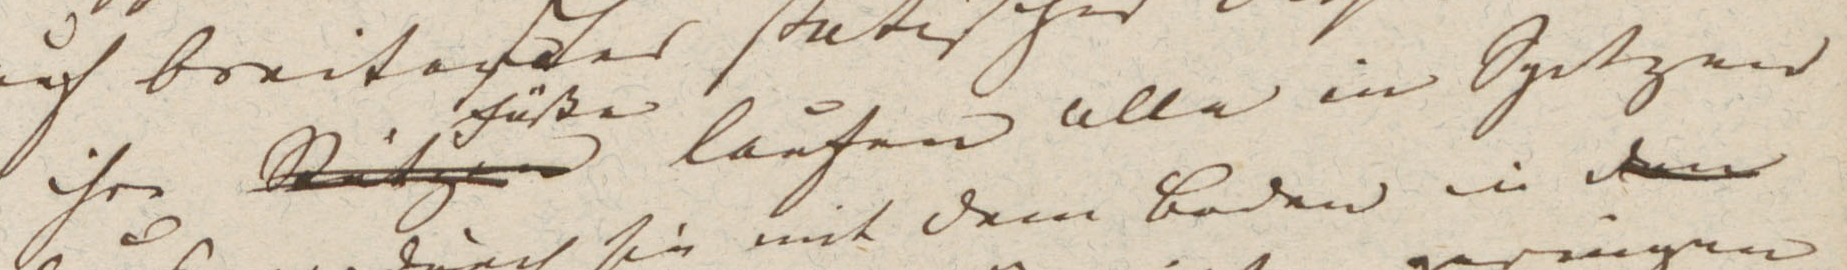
ihre stützen Füsse laufen alle in Spitzen
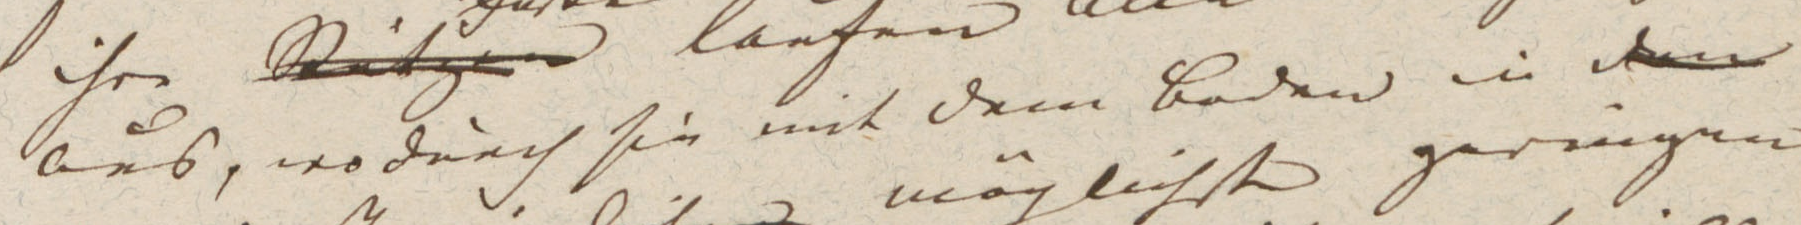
aus, wodurch sie mit dem Boden in den
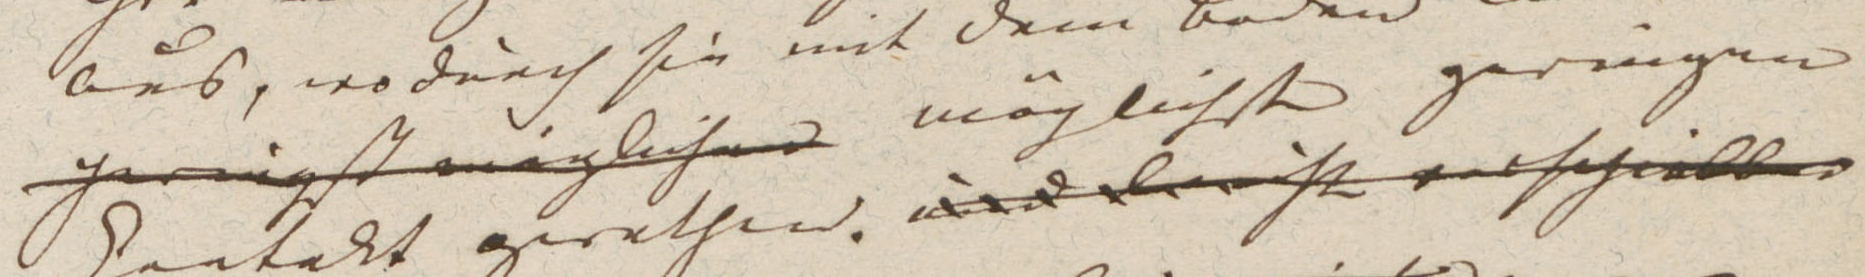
geringst möglichen möglichst geringen
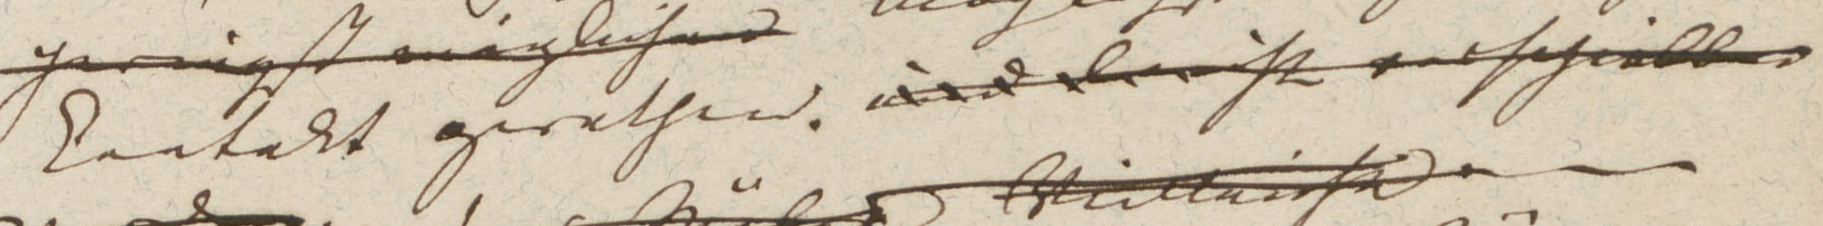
Contakt gerathen. und leicht berschiebbar
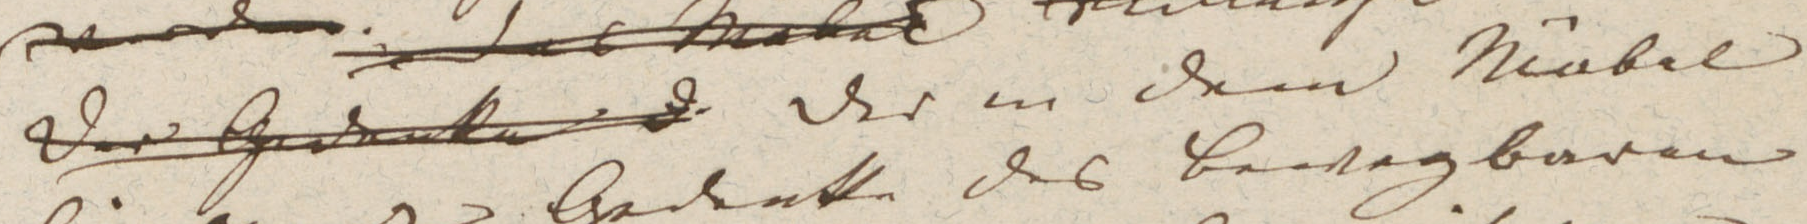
Der Gedanke d Der in dem Möbel
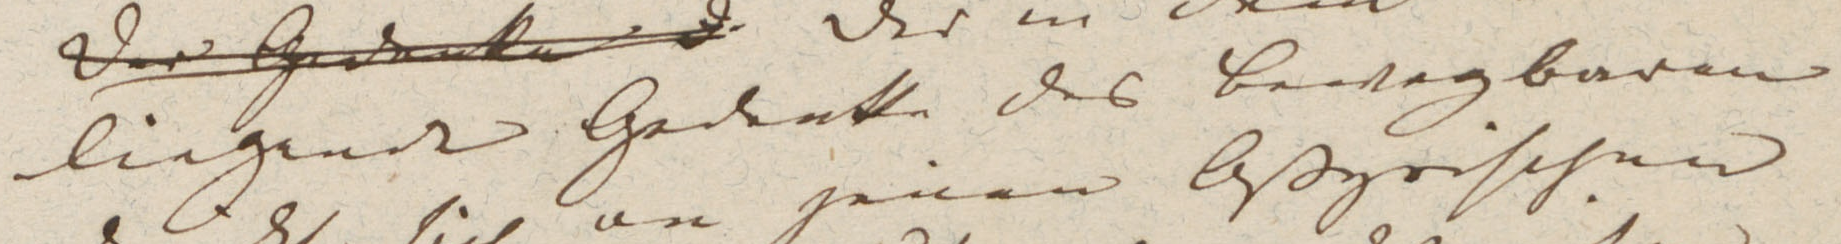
liegende Gedanke des Bewegbaren
